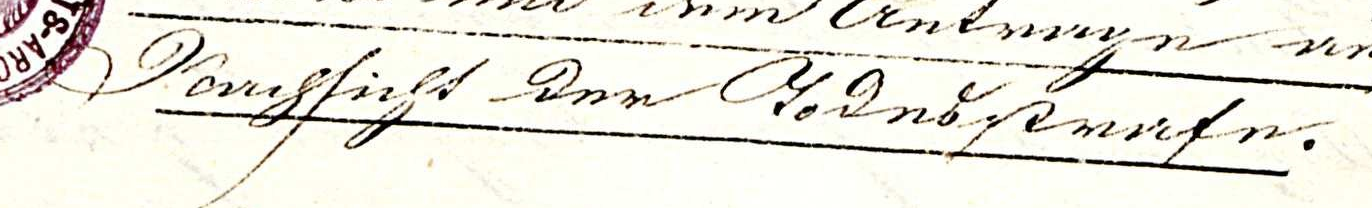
Nachsicht der Todesstrafe.
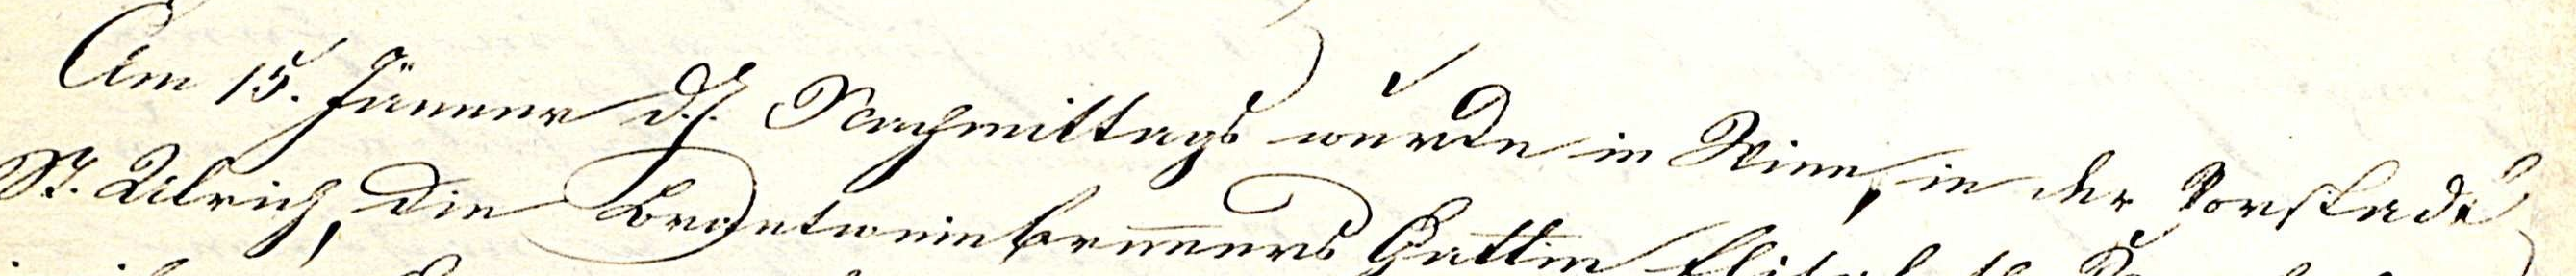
Am 15. Jänner d. h. Nachmittags wurde in Wien, in der Vorstadt
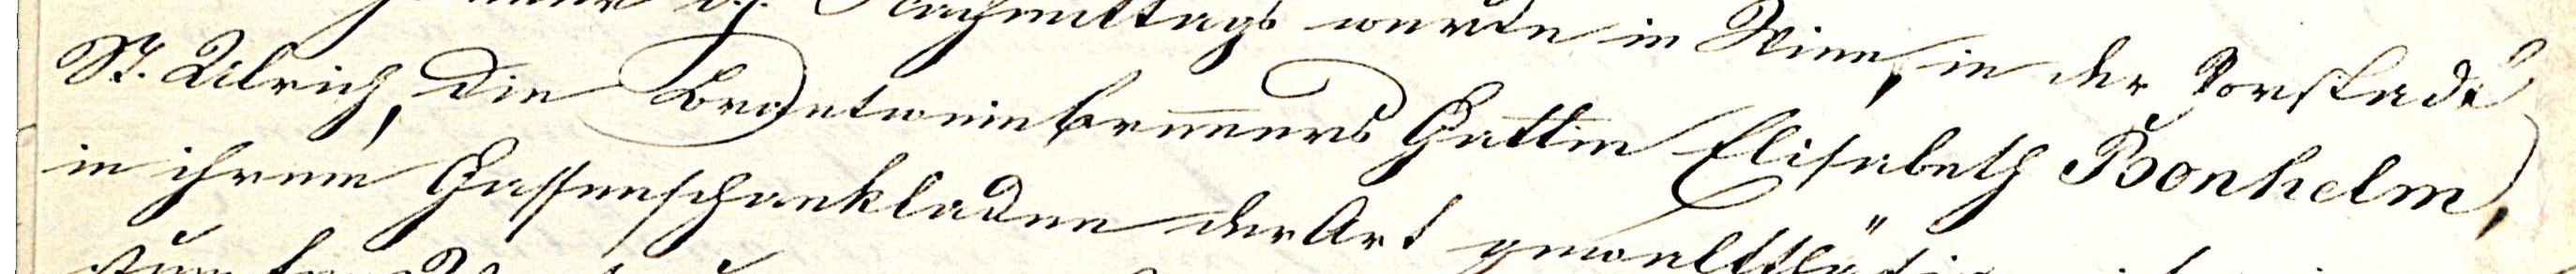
St. Ulrich, die Brantweinbrenners Gattin Elisabeth Bonhelm,
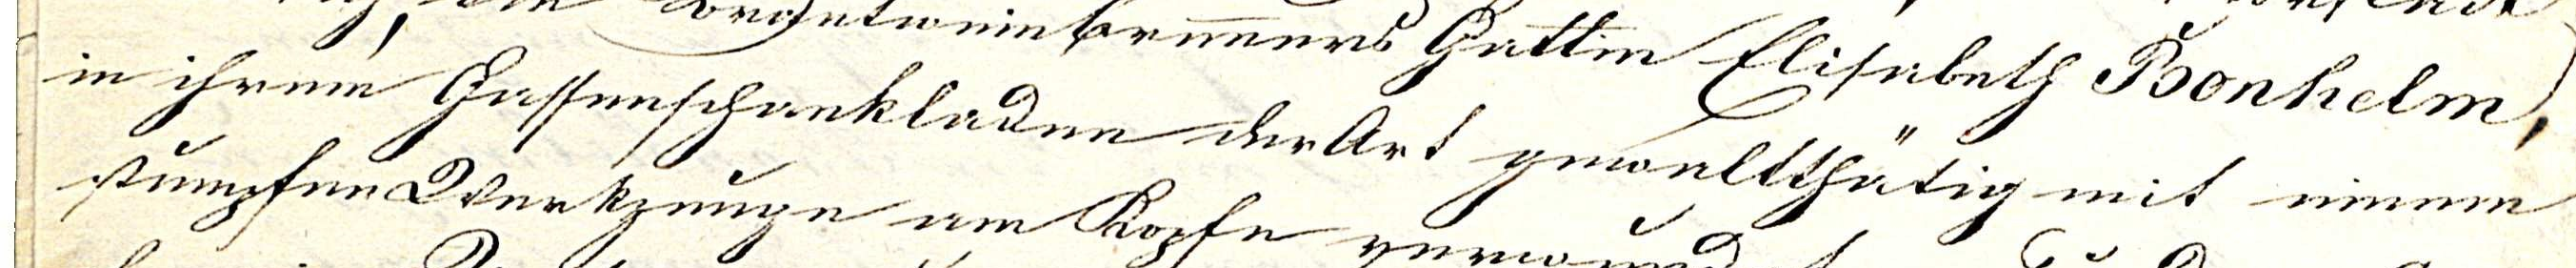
in ihrem Gassenschankladen der Art gewaltthätig mit einem
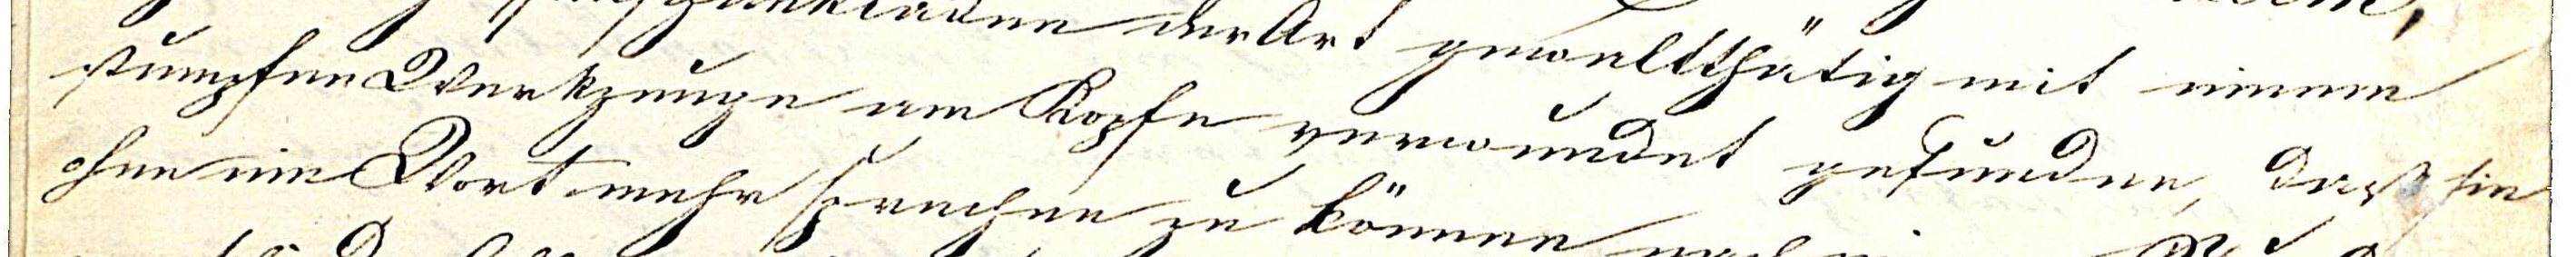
stumpfen Werkzeuge am Kopfe verwundet gefunden, daß sie
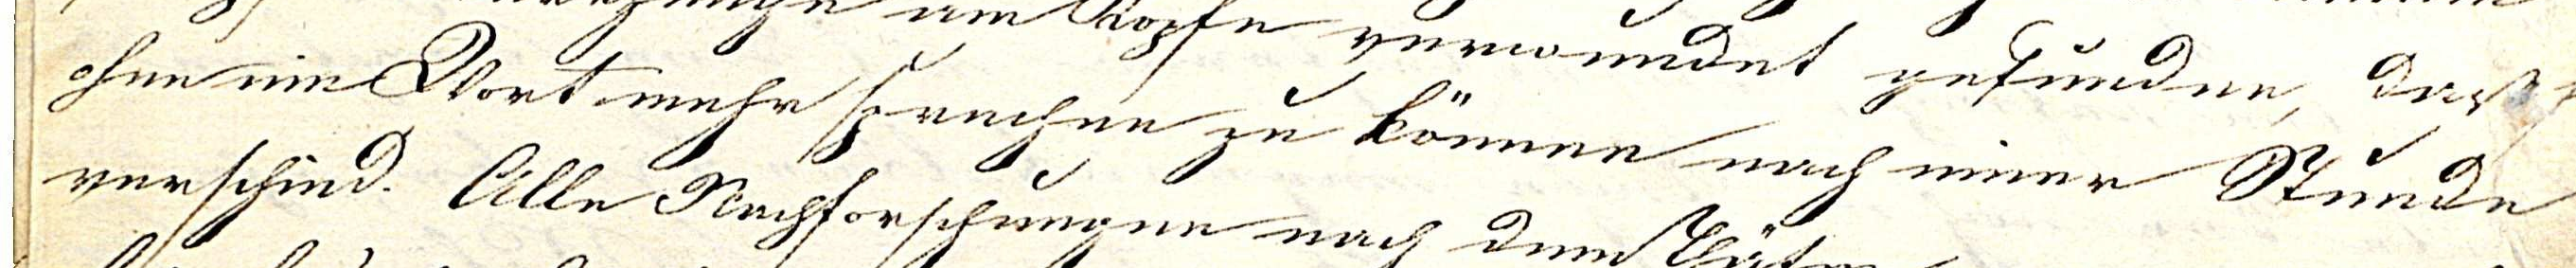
ohne ein Wort mehr sprachen zu können nach einer Stunde
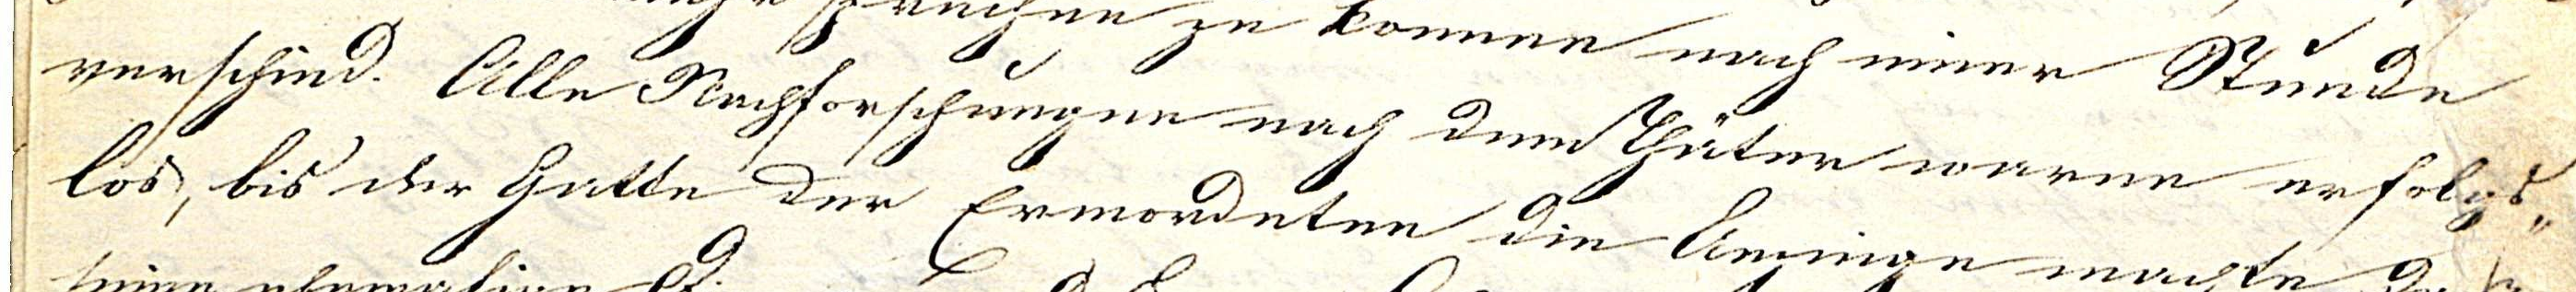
verschind. Alle Nachforschungen ach dem Thäter waren erfolgs¬
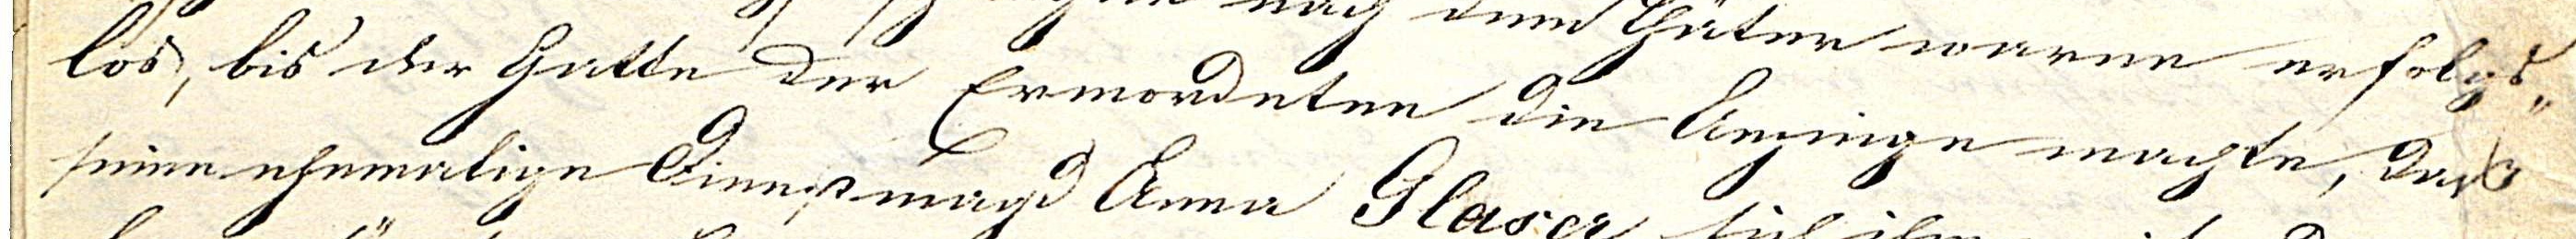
los, bis der Gatte der Ermordeten die Anzeige machte, daß
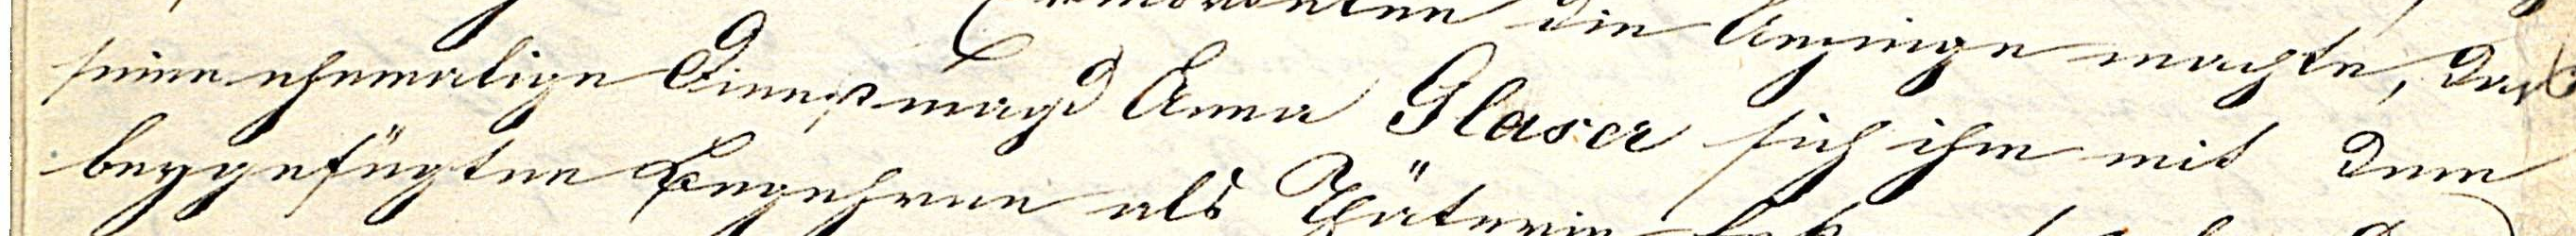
seine ehemalige Dienstmagd Anna Glaser sich ihm mit dem
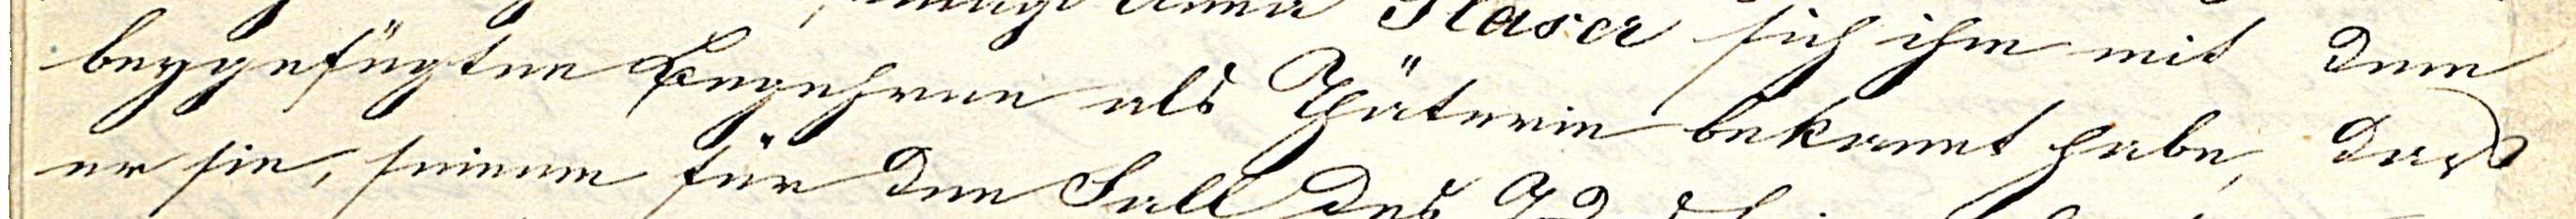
beygefügten Begehren als Thäterin bekannt habe, daß
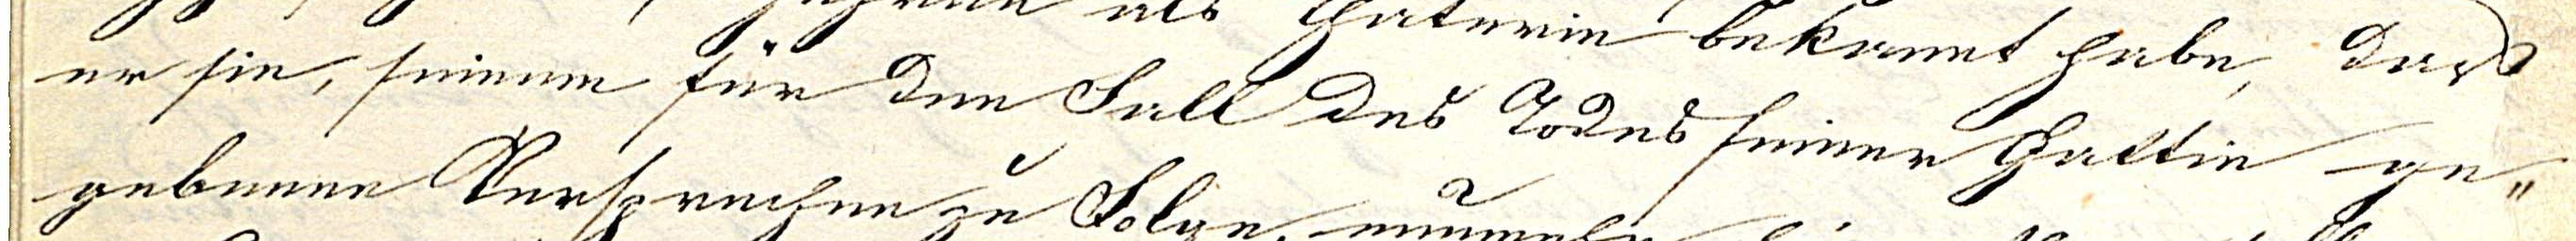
er sie, seinem für den Fall des Todes seiner Gattin ge¬
